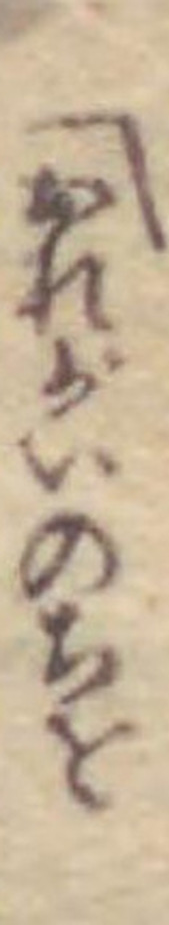〽おれがいのちを
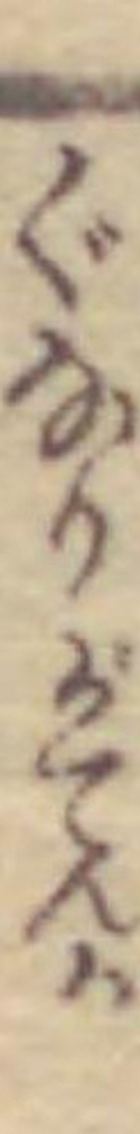ぐなりがてんが
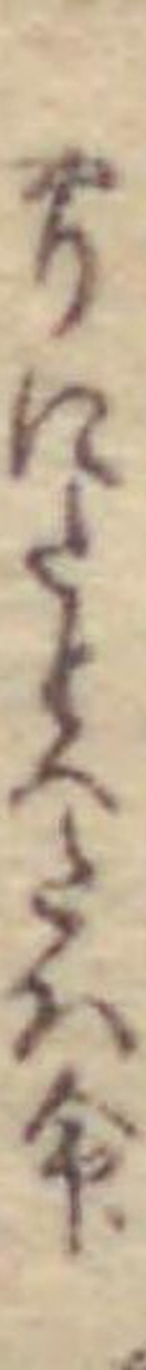やりにたとへたは命
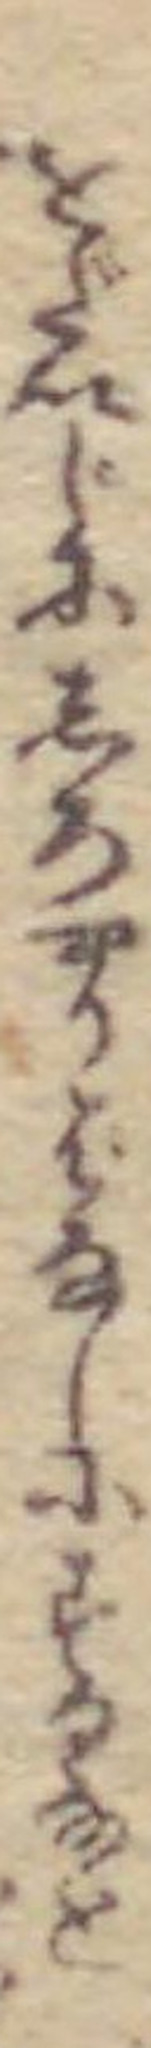をだいじにしろやりばなしにするなと
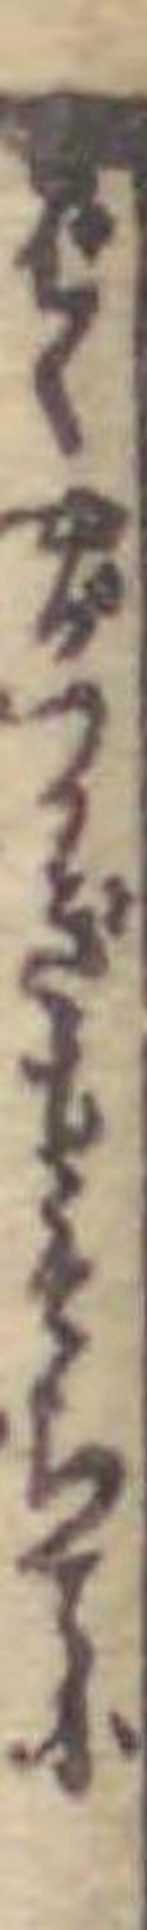ばくやがいかぎももちてに
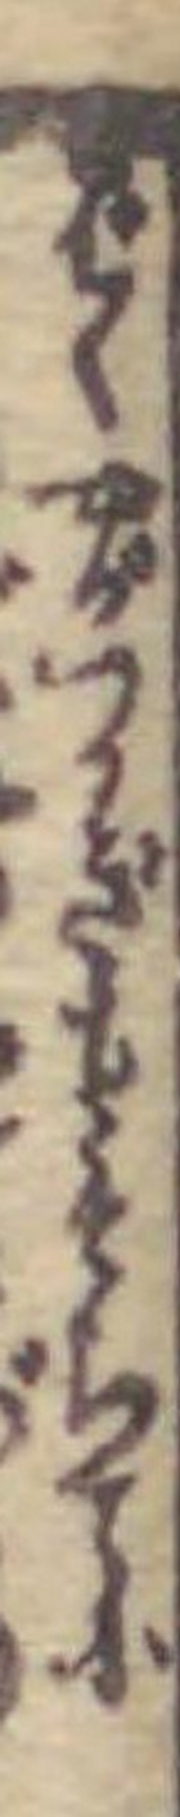ばくやがいかぎももちてに
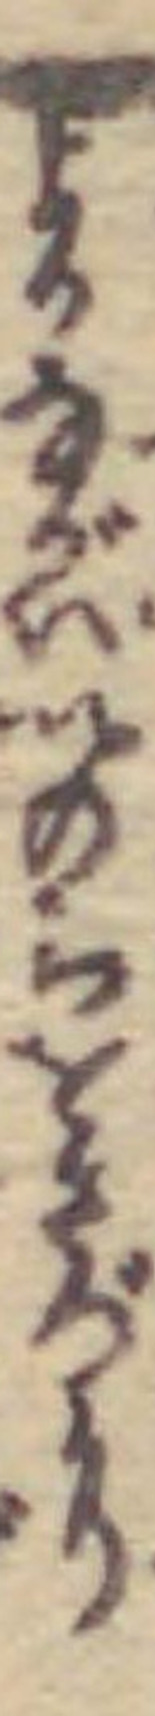よりながいいのちをきづかり
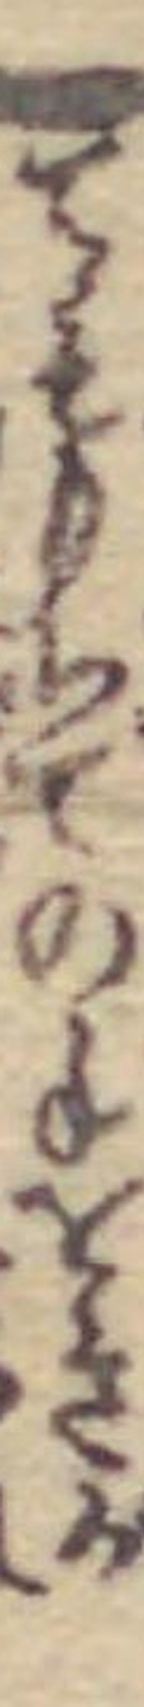て其もちての手をきが
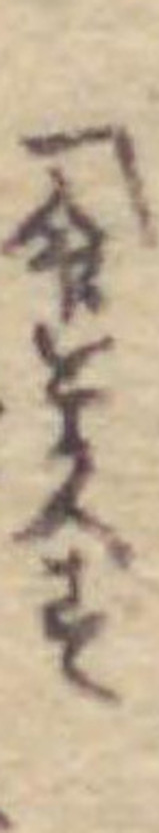〽命をかへす
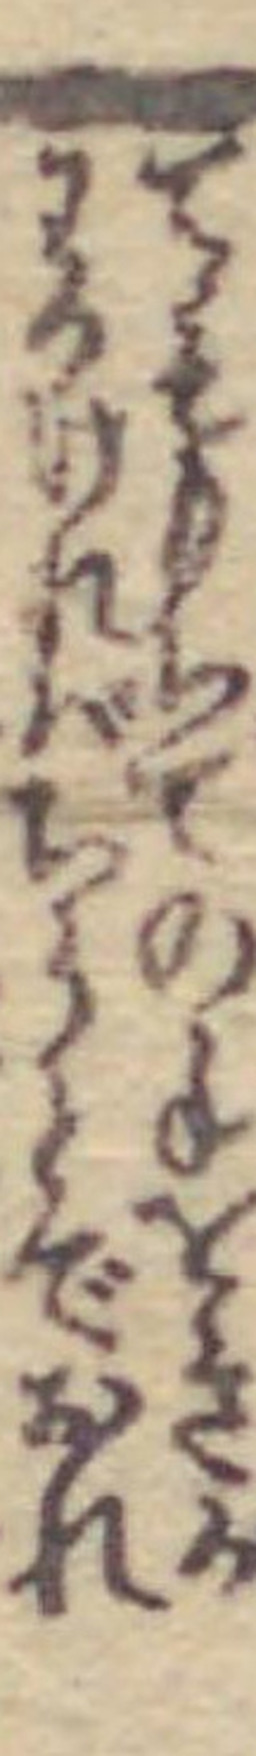わかければちらとでおれ
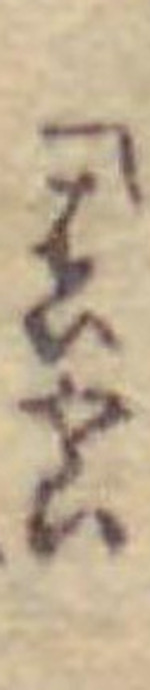〽はいやい
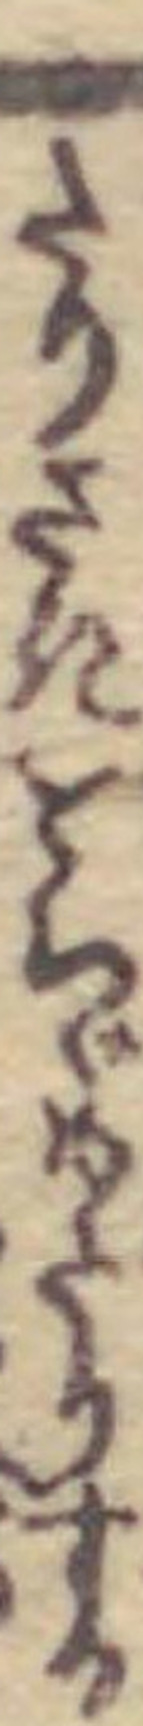たりさきをちゞめたりする
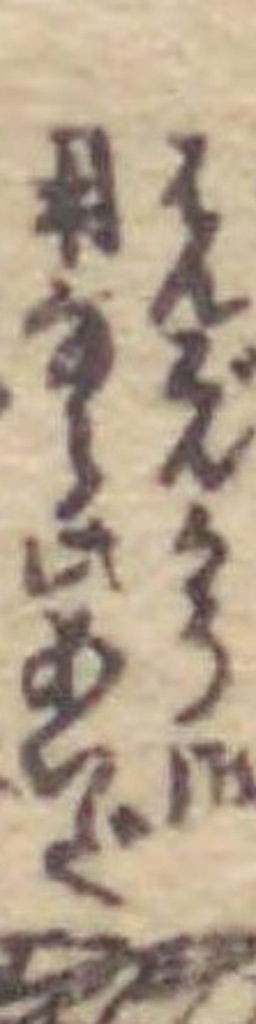用なら此あいだ
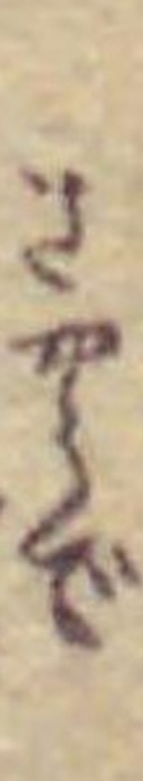さやうで
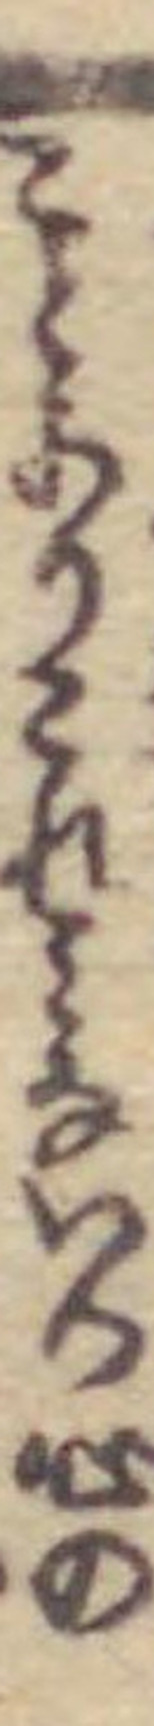ことありこれみないつ心の
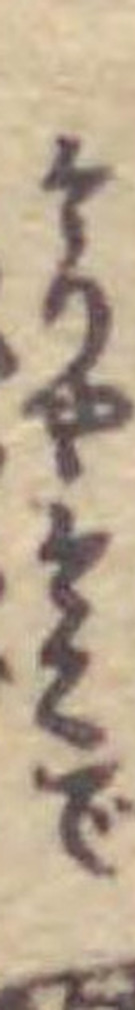そりやそこで
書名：御誂染長寿小紋 : 3巻
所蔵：国立国会図書館 National Diet Library, JAPAN
